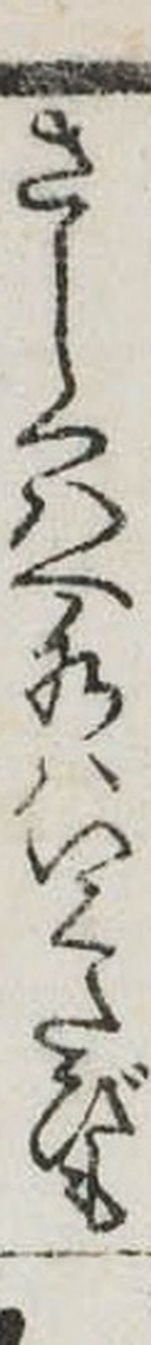さしくはへ水はいくたびも
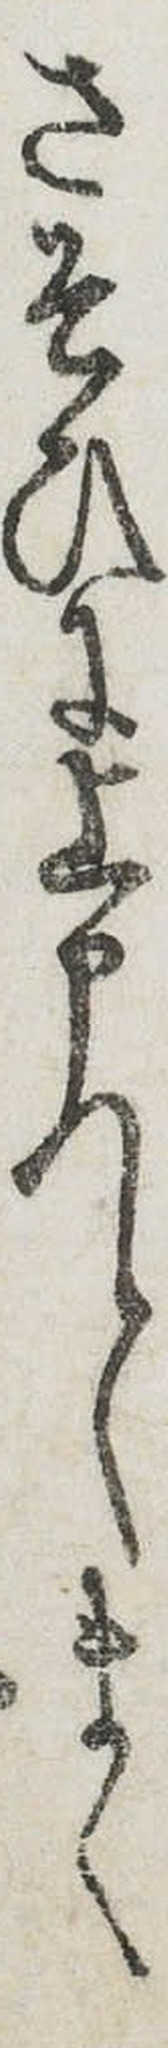さそひに上申べく候まゝ
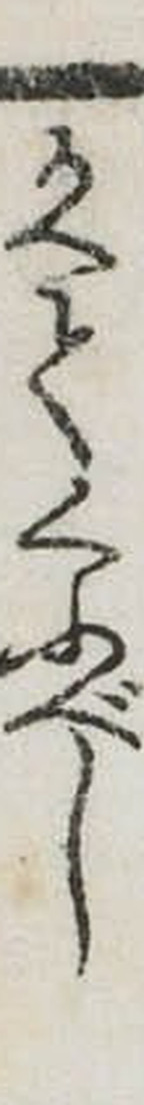かへてくふべし
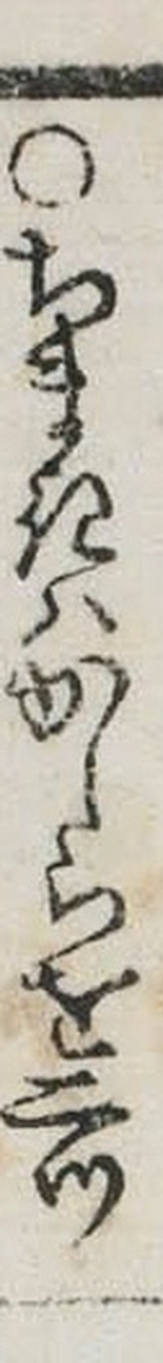○ちまきはかしらを二ッ
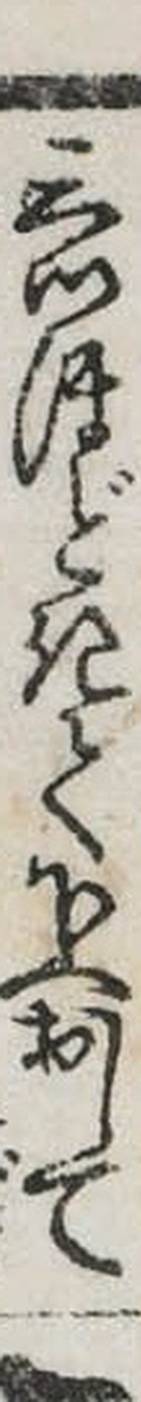三ッほどきて下へおして
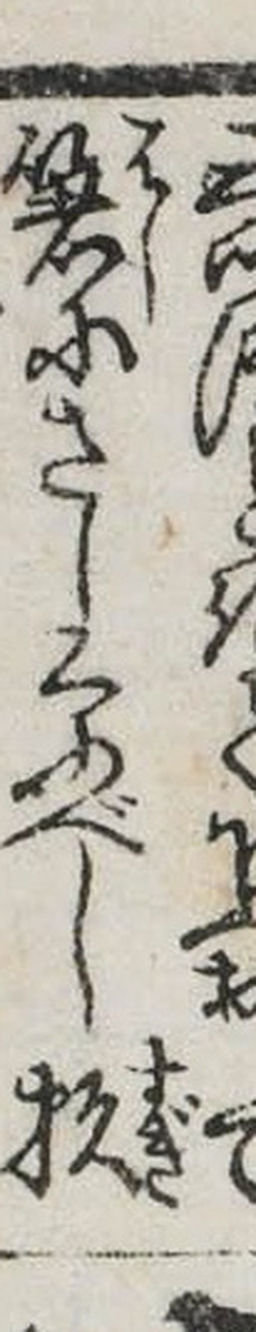箸にさしくふべし杉
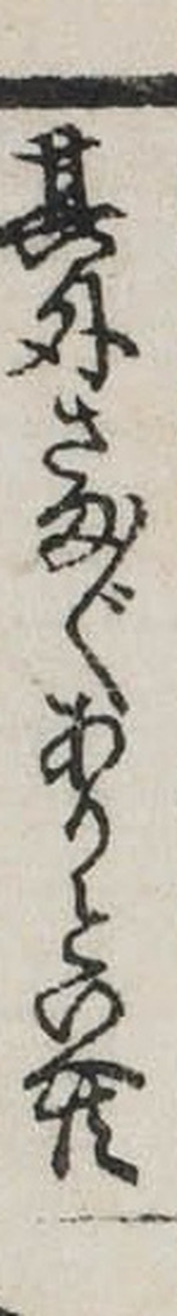其外さま〴〵ありといへ共
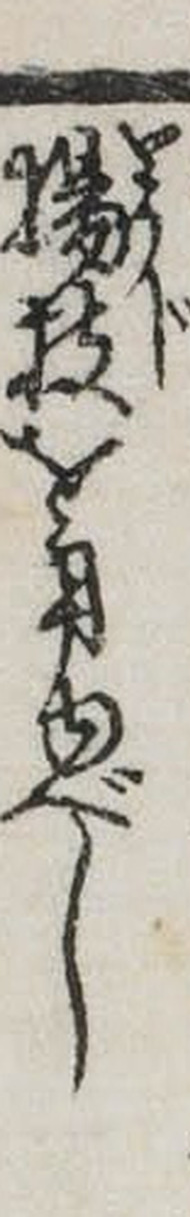楊枝を用ゆべし
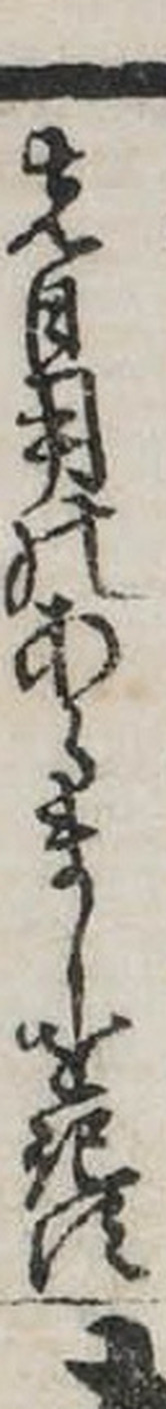先日用のあらましを記す
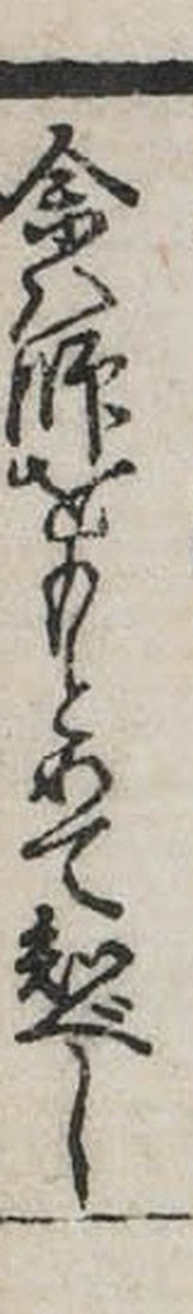余は師をもとめて知べし

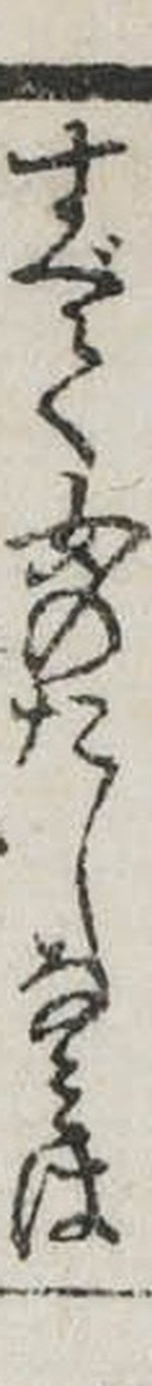すべて女のたしなみは
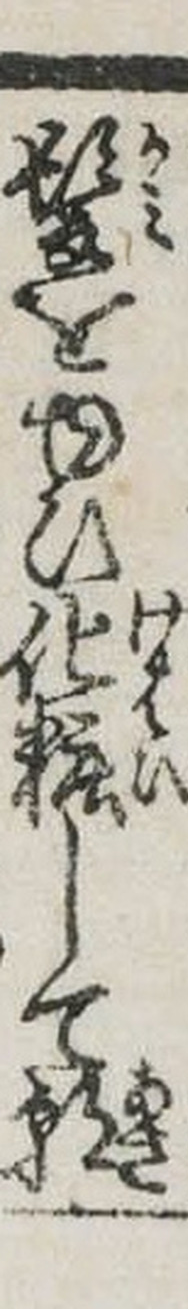髪をゆひ化粧して朝
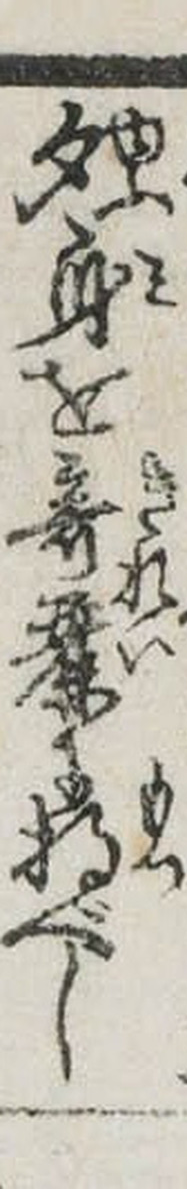夕身を奇麗に持べし
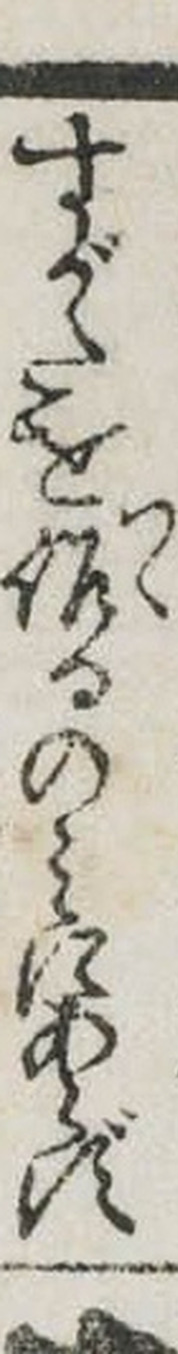すがたを作るのみにあらず
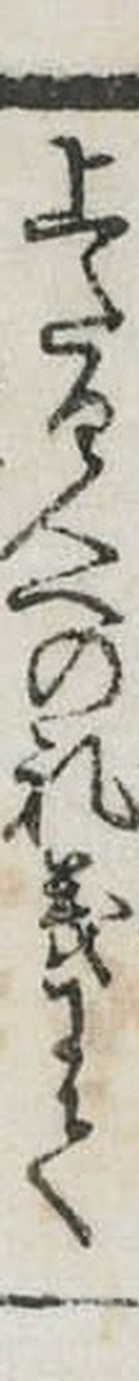上たる人への礼義にて
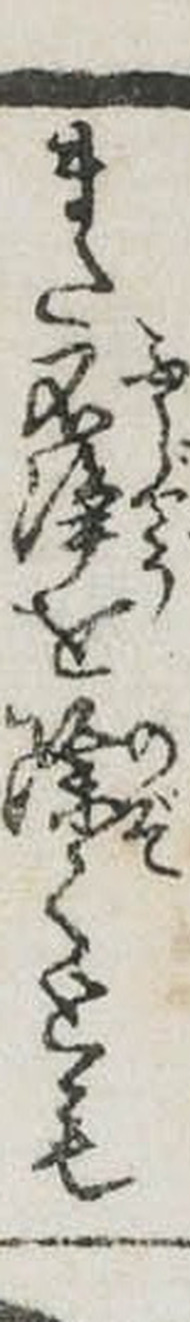また不浄を除くとも
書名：頭書萬用婦人手紙之文言
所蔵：東京学芸大学教育コンテンツアーカイブ
